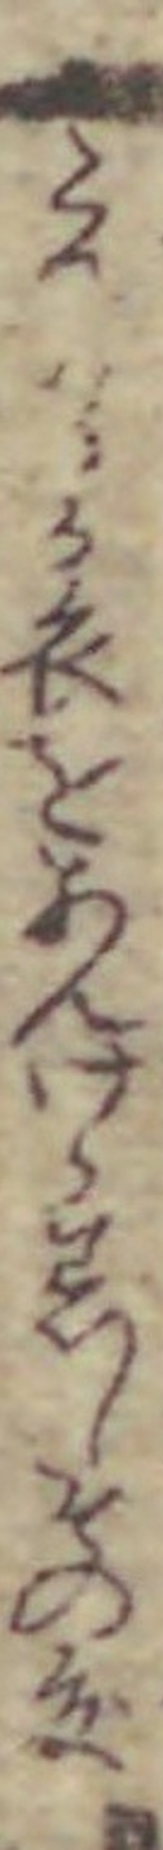こんけらか衣をあんけら着しその度
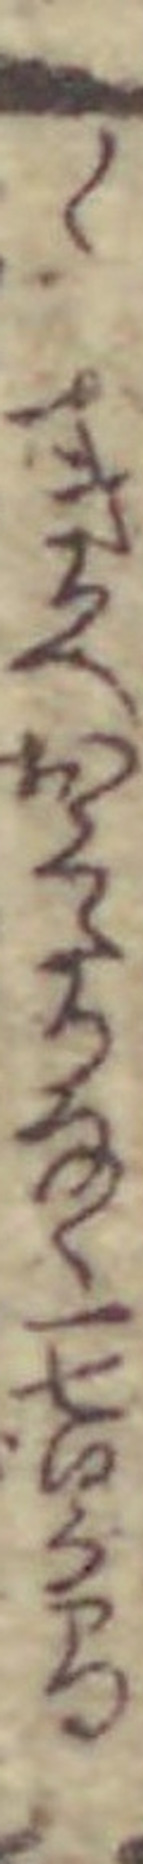〳〵ふきかへおこたりなく一七日か間
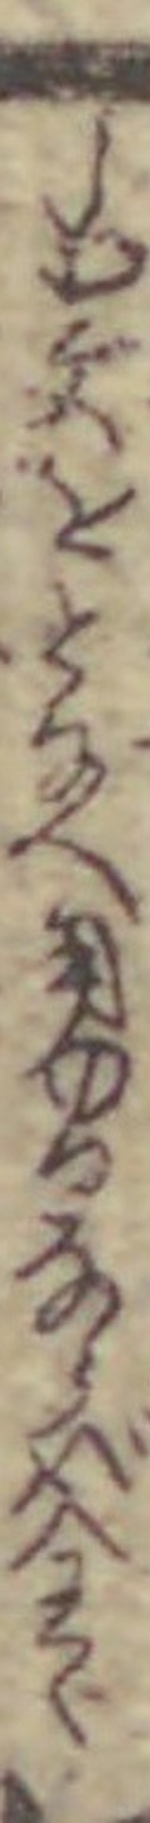しゆ文をとなへ用ゆるならば全く
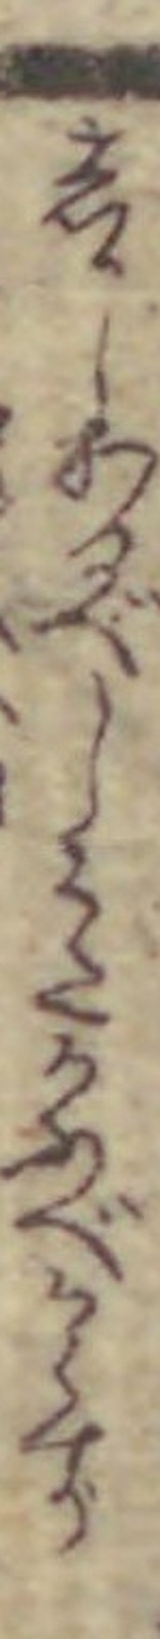しるしあるべしうたかふべからず
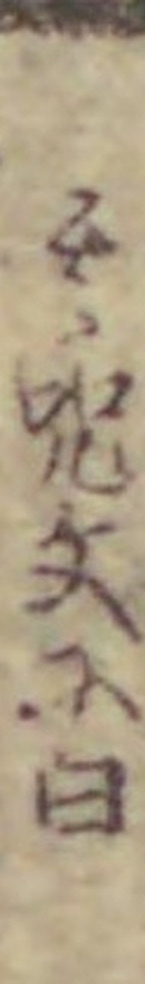其呪文に曰
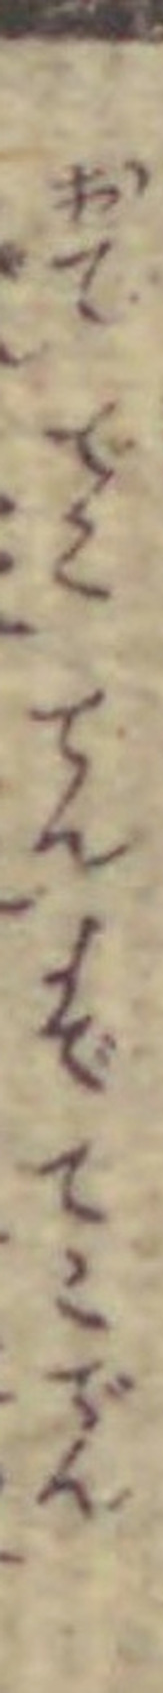おででこてんにでてこでん
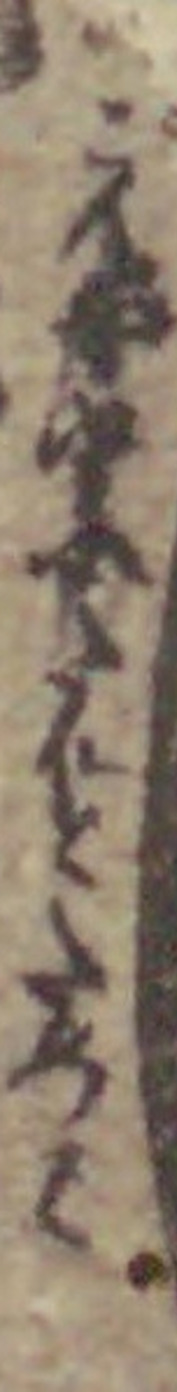こんや中にたんとためて
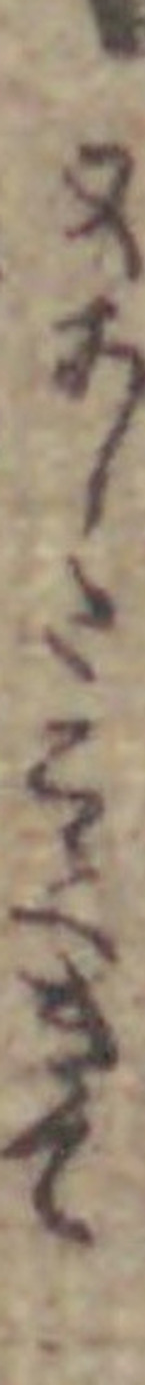またあしたここへきて
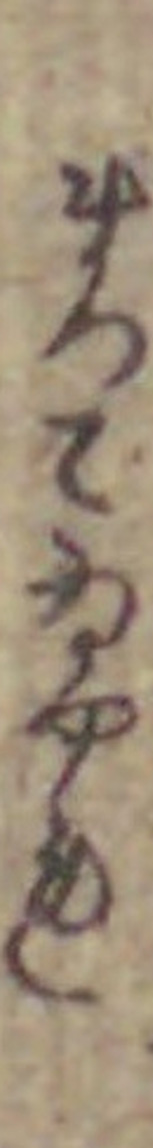まつてゐやれ
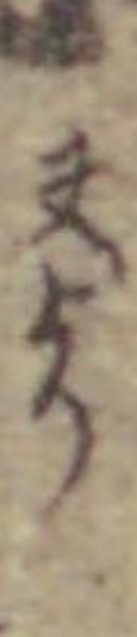夫より
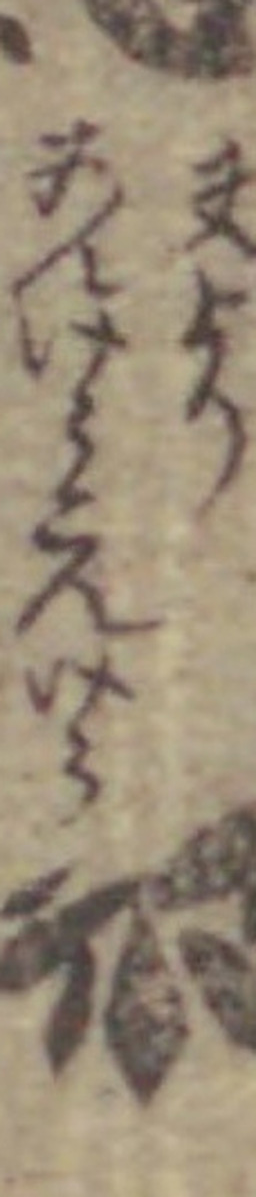あんけらこんけら
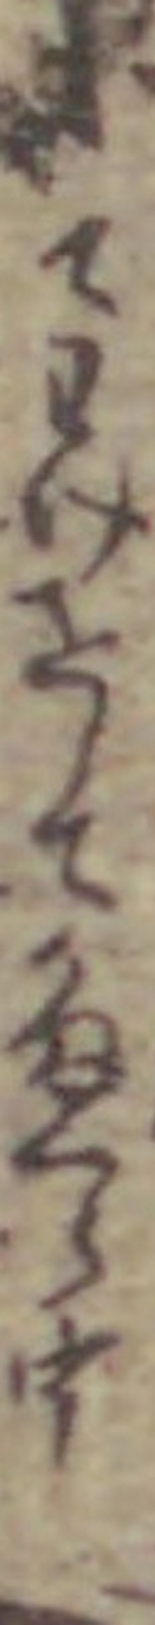てわけをしてかまくら中
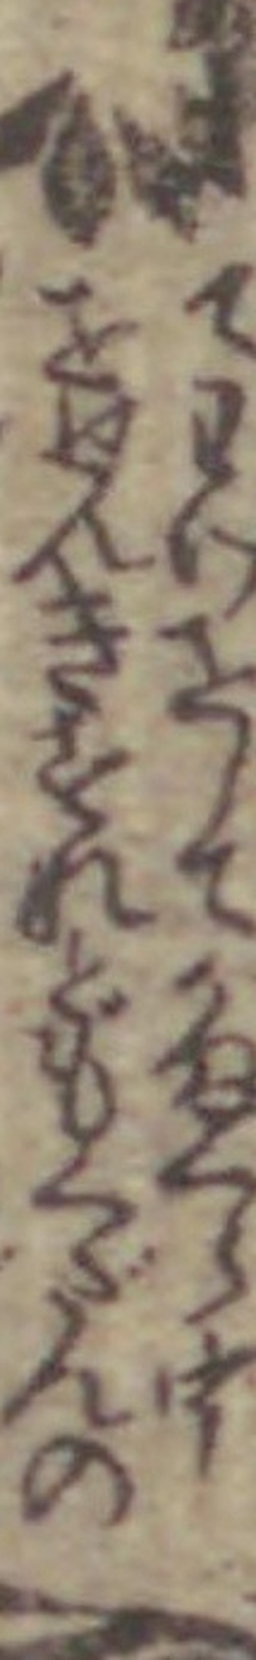をせんきすれどもくだんの
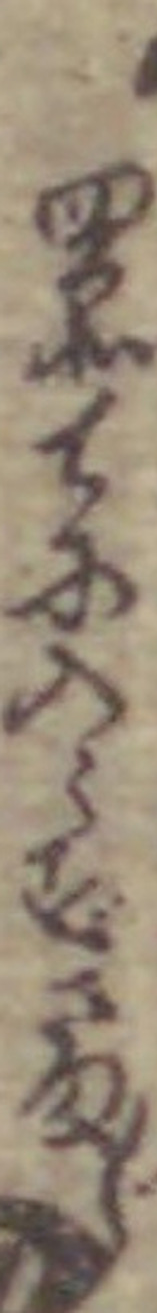四品てに入らずさま〴〵
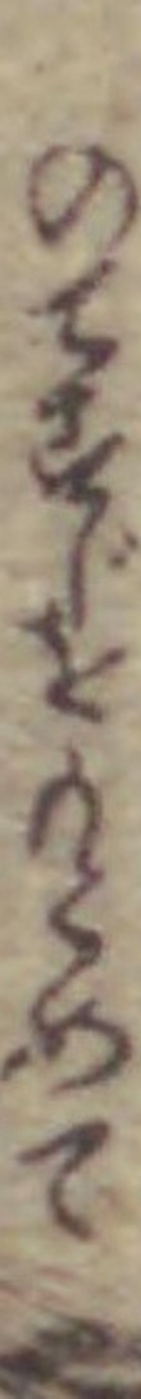のてすじをもとめて
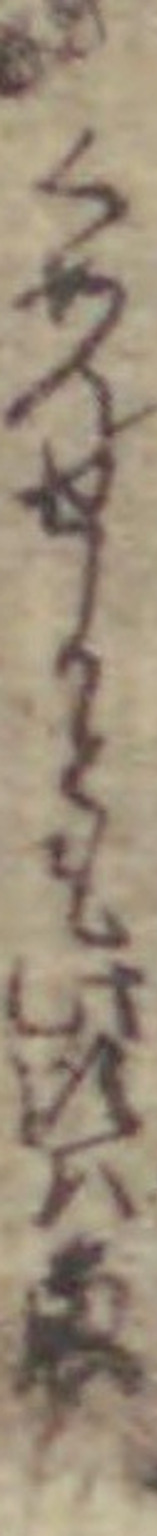くめんせしかとも此頃は魚
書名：止而道致虚録 3巻
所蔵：国立国会図書館 National Diet Library, JAPAN
